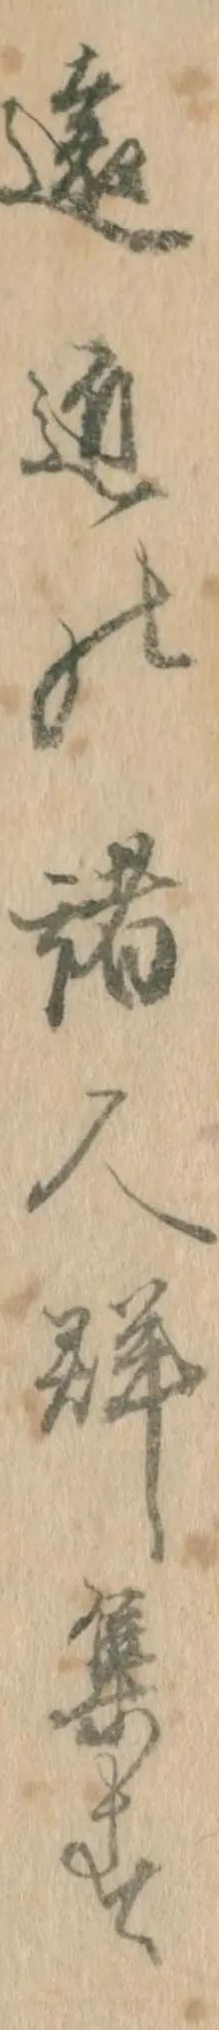遠近の諸人群衆す
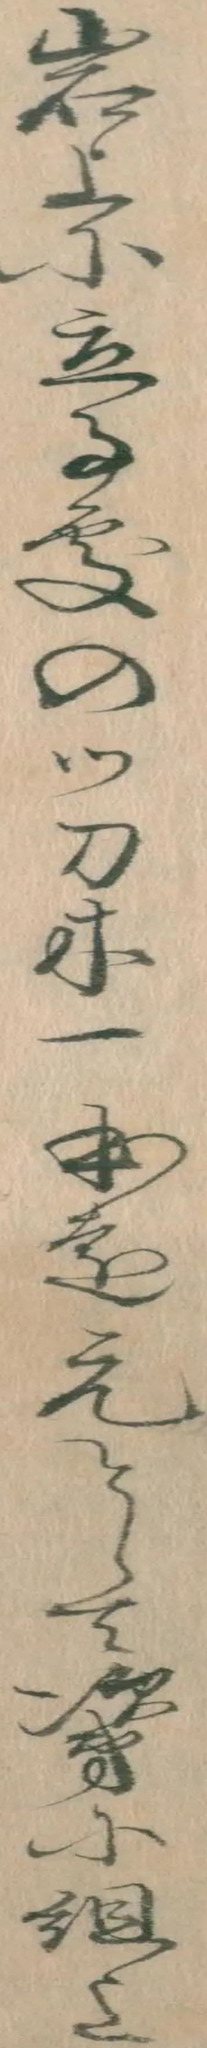岩上に立る処のツカ木一本を元として次第に組上
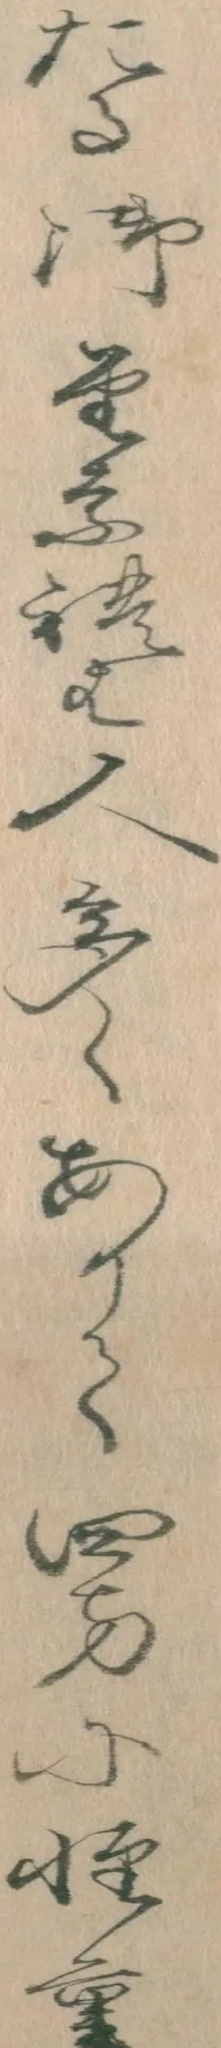たる御堂なれは人多くありて四方に軽重
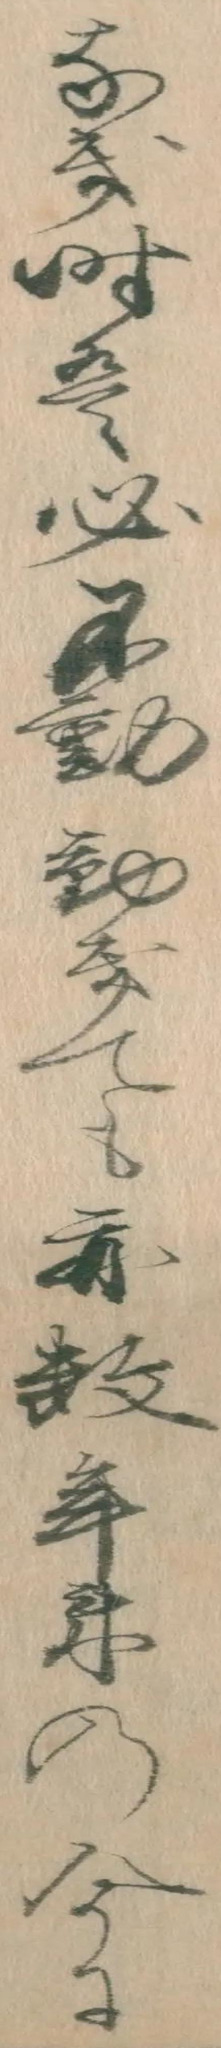なき時は必不動動きても亦数年来の今に
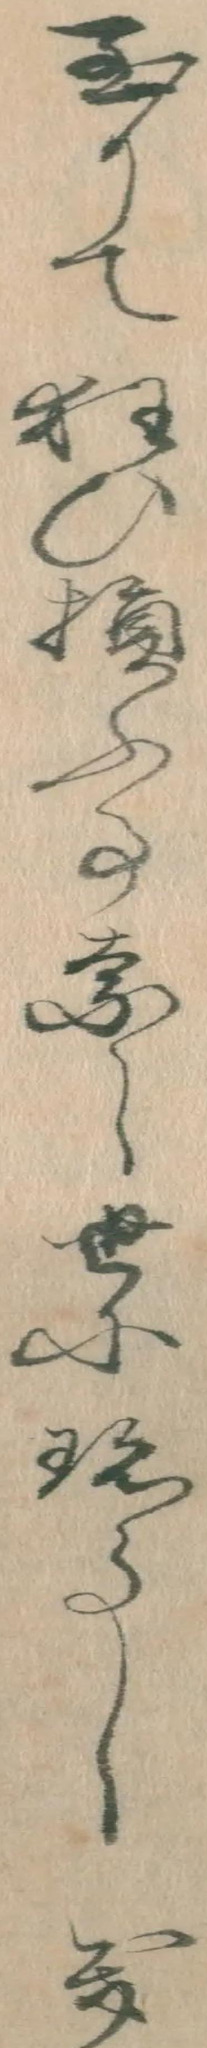至りて狂ひ損ふ事なし世に珍らしき
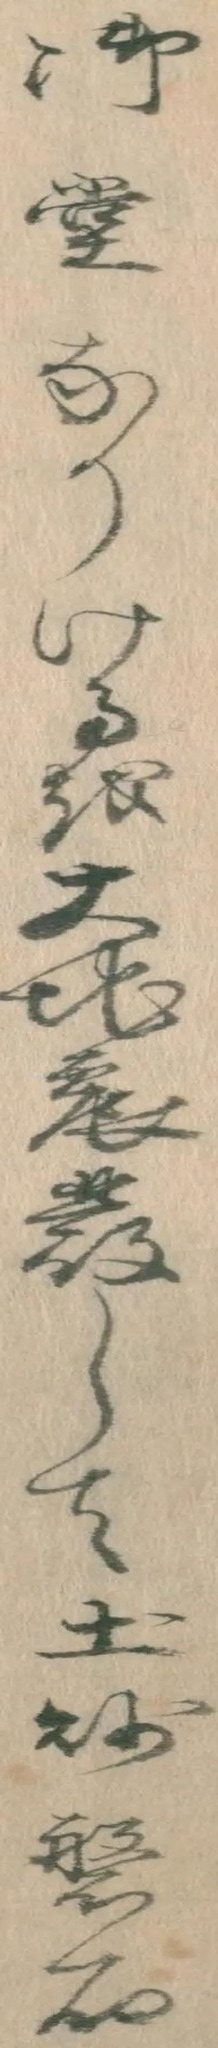御堂なりけるを大地震発して土砂磐石
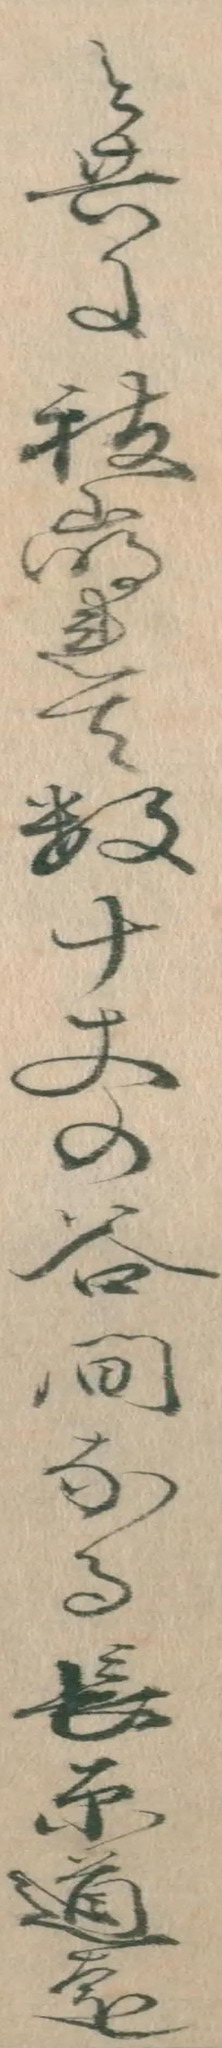と共に抜崩れて数十丈の岩間なる長原道を
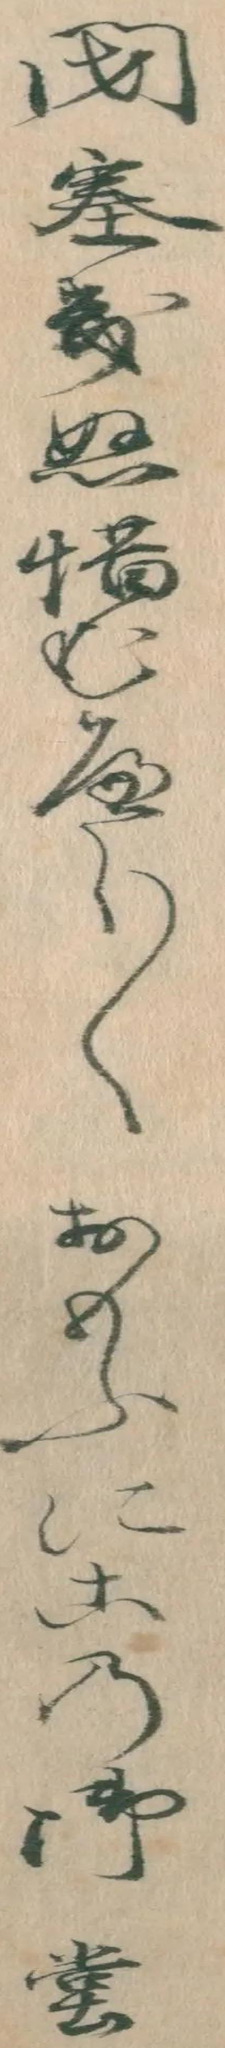閉塞きぬ惜むへし〳〵おもふにこの御堂
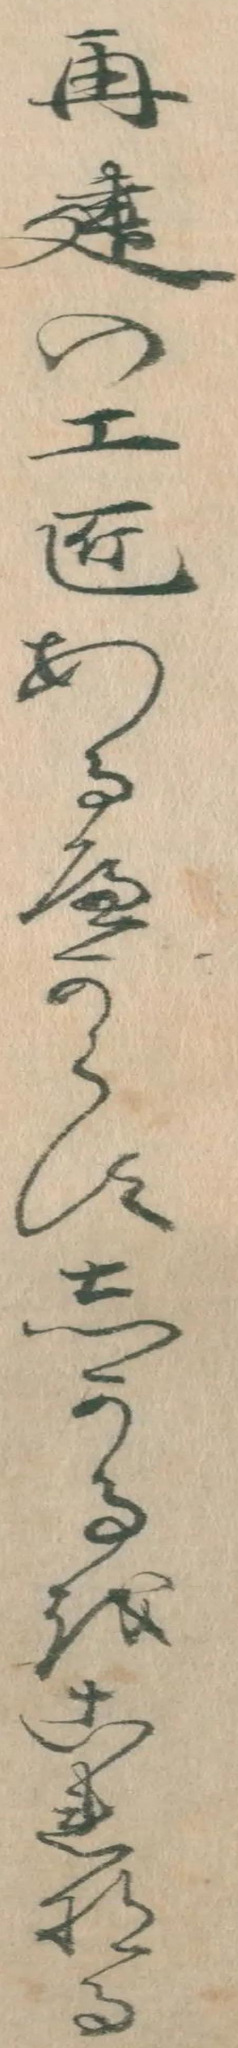再建の工匠あるへからすしかるをこれなる
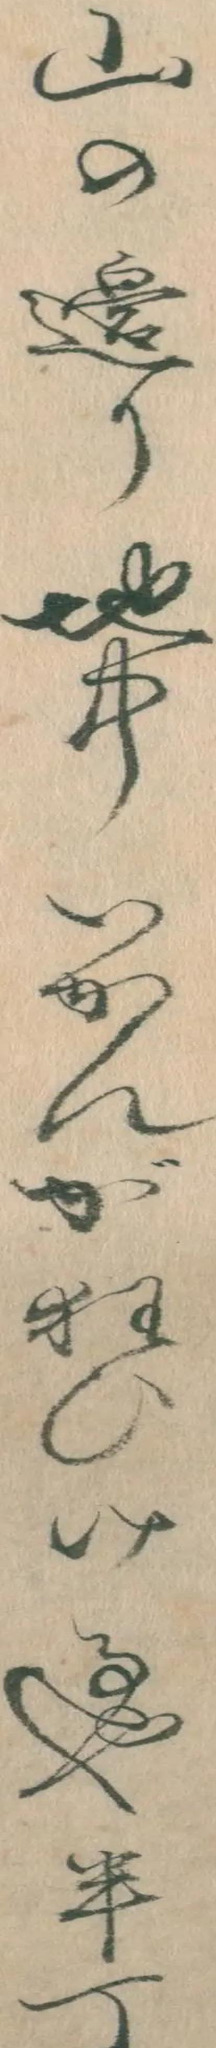山の辺り地中いかんが狂ひけるや半丁
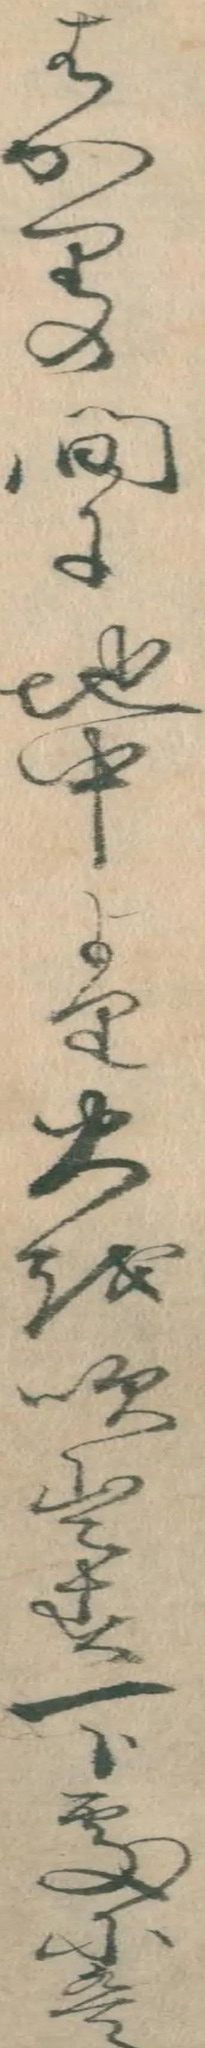はかりの間に地中より火を吹出す一ト処には

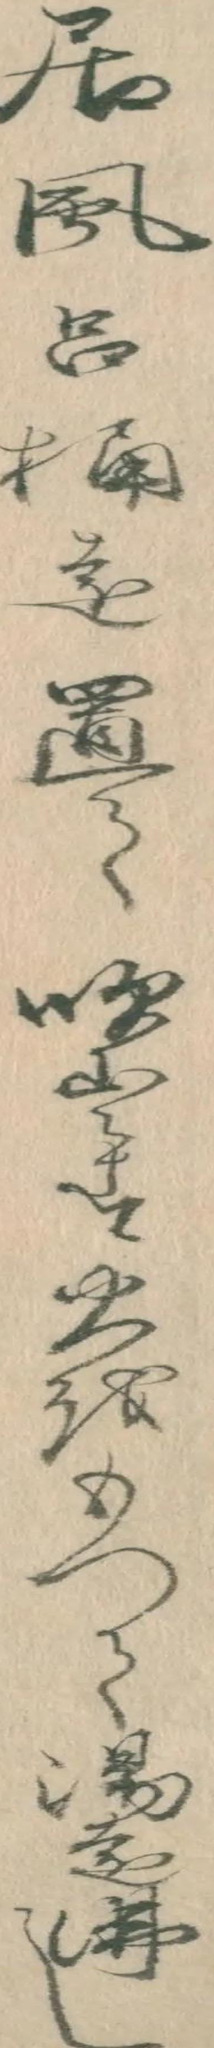居風呂桶を置て吹出す火をもつて湯を沸し
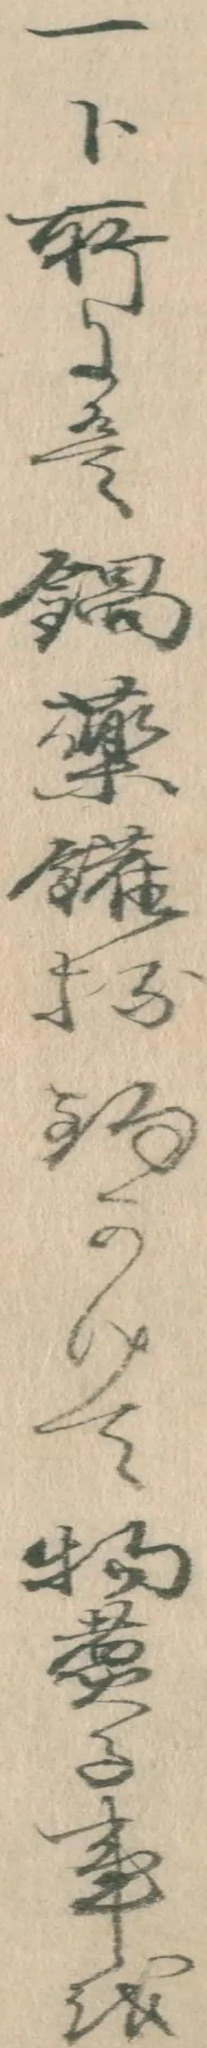一ト処には鍋薬罐抔釣かけて物煮る事を
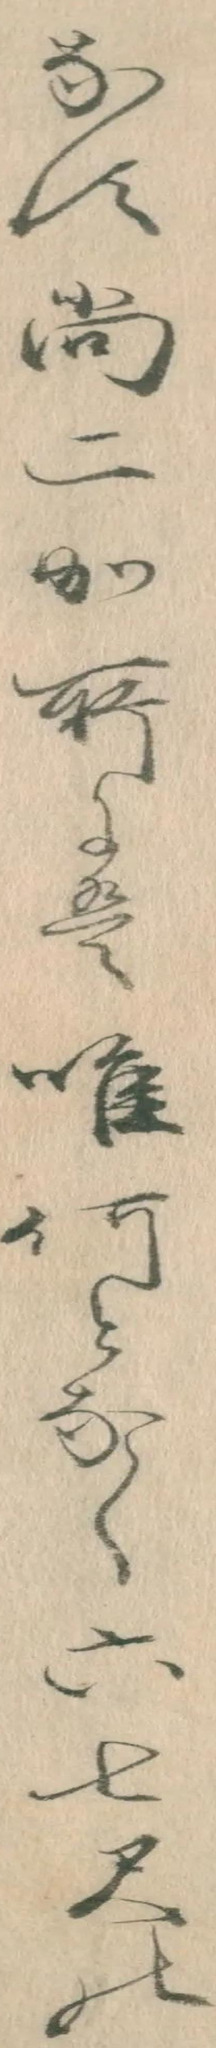なす尚二か所には唯何となく六七尺の
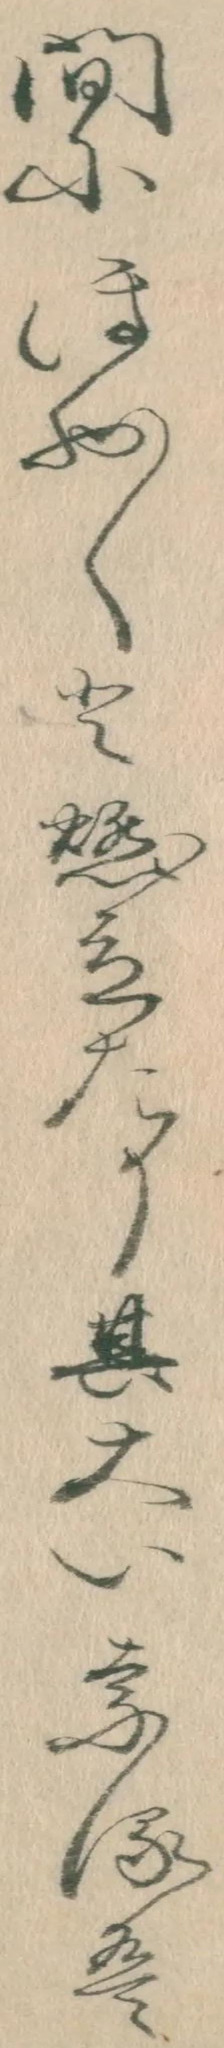間にほふ？〳〵と燃立たり其大いなるは
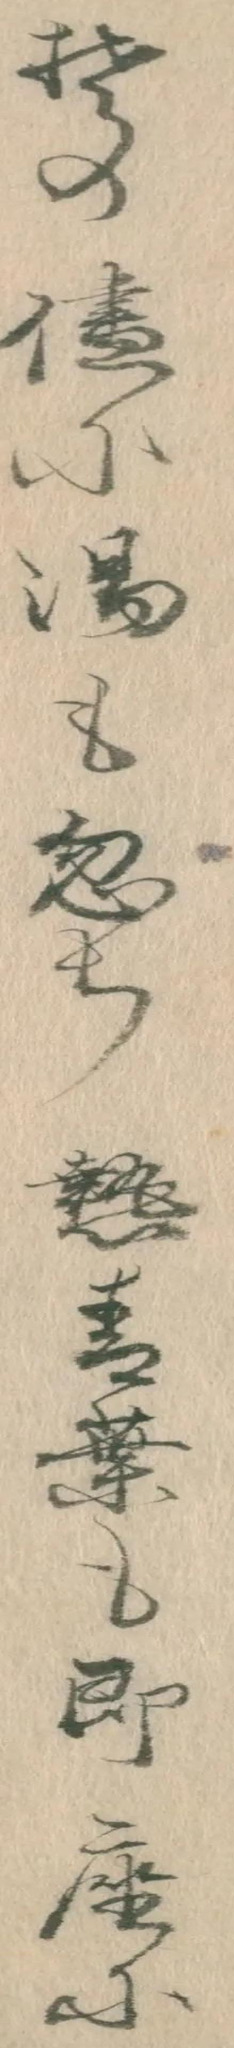その侭に湯も忽ち熱青葉も即座に
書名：俗語之種. [6]
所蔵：国立国会図書館 National Diet Library, JAPAN
